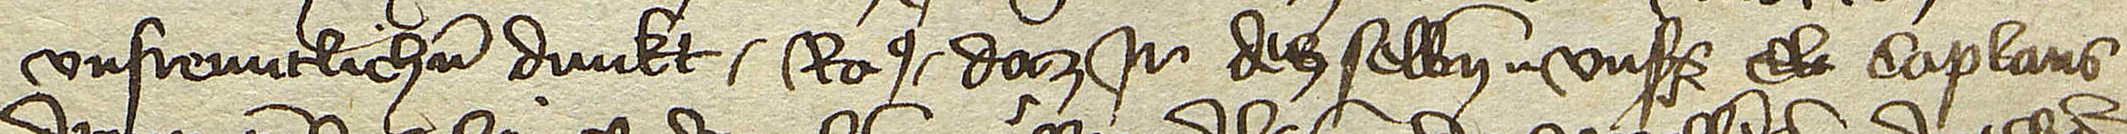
vnfreuntlichn* dunkt / Ro* / daʒ Ir des ſelbn* ~ vnſ*s Cl Caplans
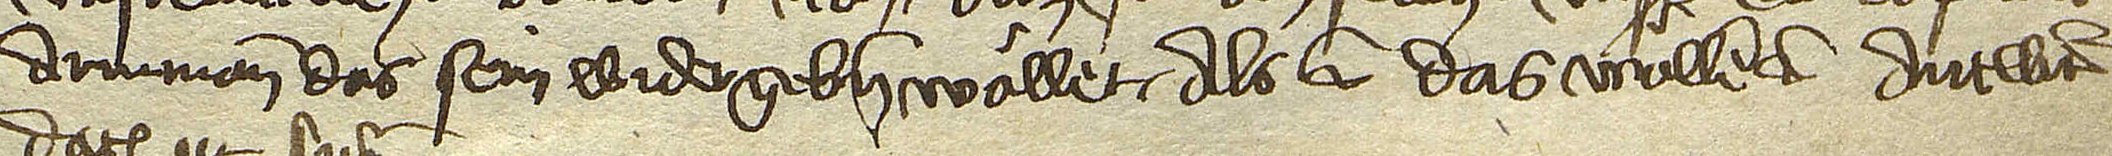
Armman* das ſein widergebn* wöllet / Als ec* das wülle* ec* Antw*t
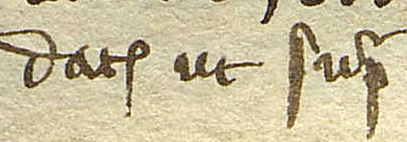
dat* ut ſup*
